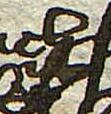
iſt
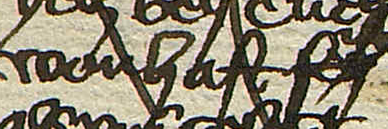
wonhaft ſey
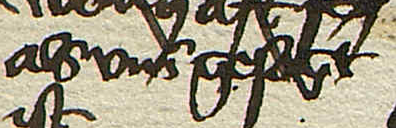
als vns geſagt
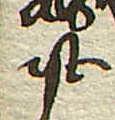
ist
